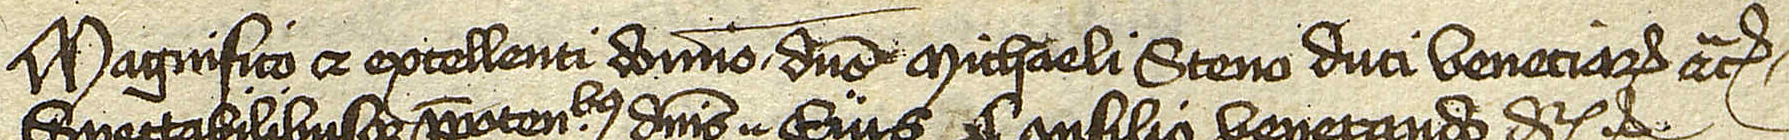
Magnifico @ excellenti domi*o / d*no Michaeli Steno duci Veneciarum ec* /
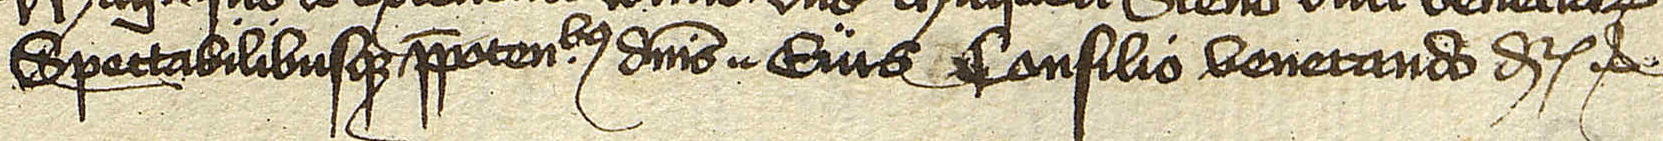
Spectabilibusq* p*poten* . d*nis ~ Eius Conſilio venerando d* §
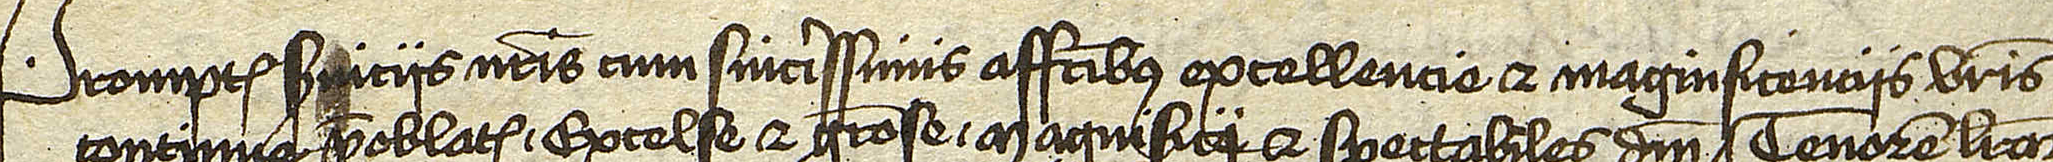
Prompt* ſ*uiciis n*ris cum ſinc*iſſimis aff*c*ib* excellencie @ magnificenciis v*ris
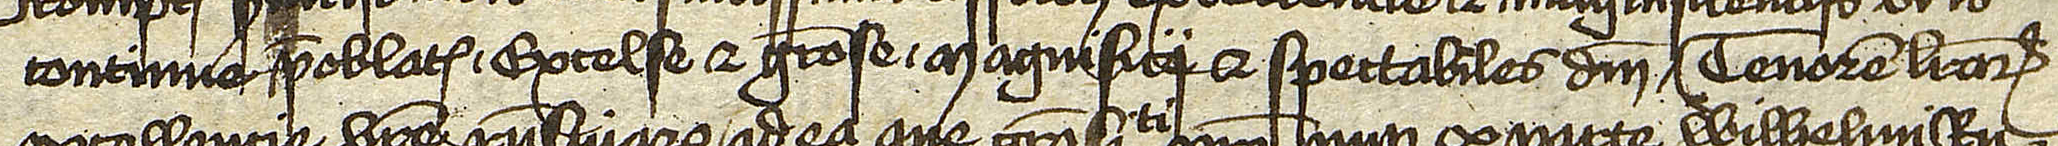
continue p*oblat* / Excelſe @ g*r*oſe / Magnifici @ ſpectabiles d*ni / Tenore* l*ra*
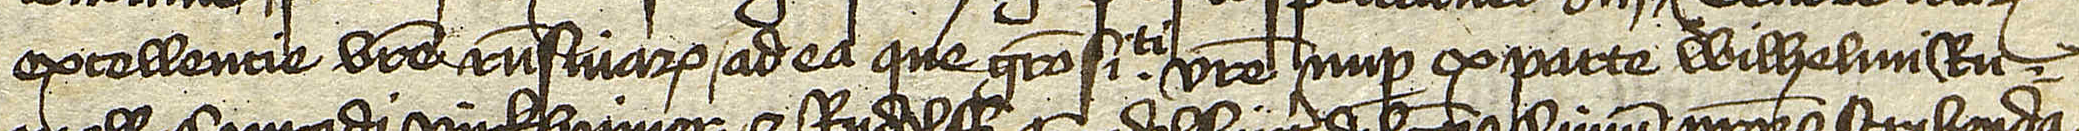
excellencie v*re r*nſiua* / ad ea que gr*oſi* . v*re nup* ex parte Wilhelmi Ru =
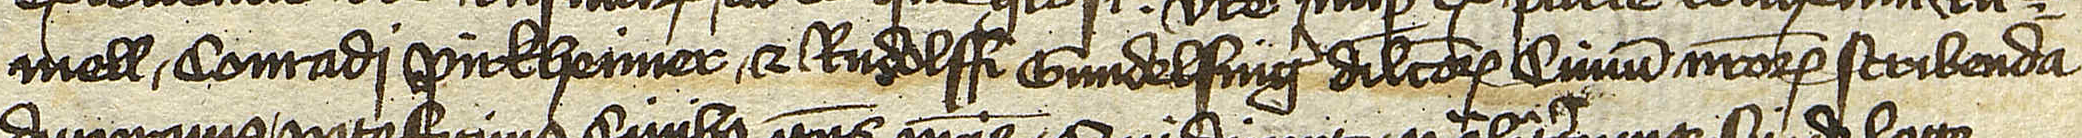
mell / Conradi Pirkheimer / @ Rudolffi Gundelfing* dil*to* Ciuiu* n*ro* ſcribenda
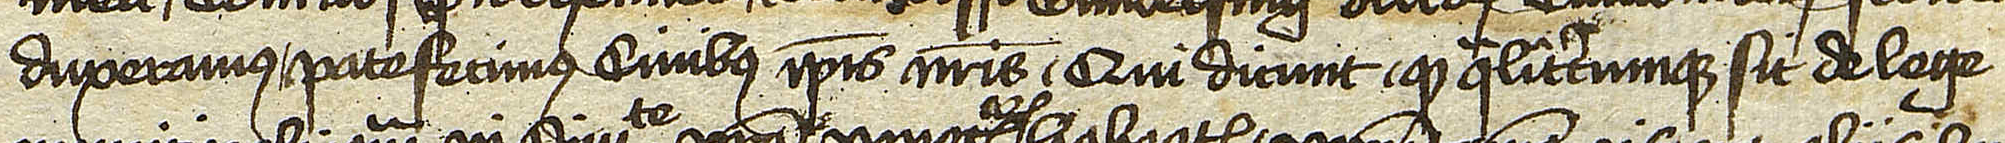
duxeram* / patefecim* Ciuib* ip*is n*ris / Qui dicunt / q* q*lit*cumq* ſit de lege
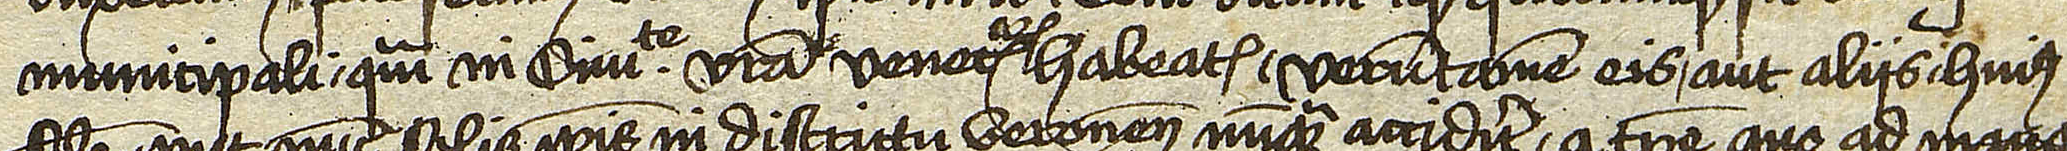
municipali / q*m in Ciui* . v*ra Venet* habeat* / veru*tame* eis / aut aliis / hui*
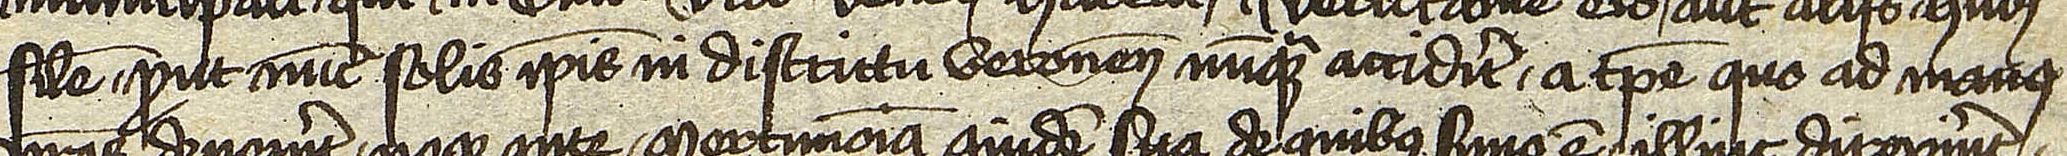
ſi*le / p*ut nu*c ſolis ip*is in diſtrictu* Veronen* nu*q* accid*it / a t*p*e quo ad man*
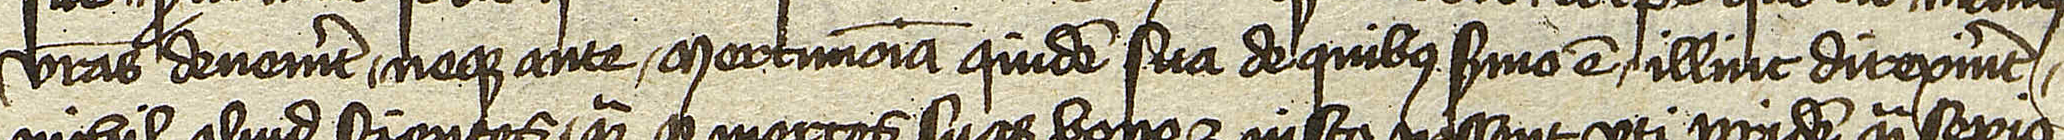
v*ras deven*it / neq* ante / Mercimo*ia quide* ſua de quib* ſ*mo e* / illinc direx*int* /
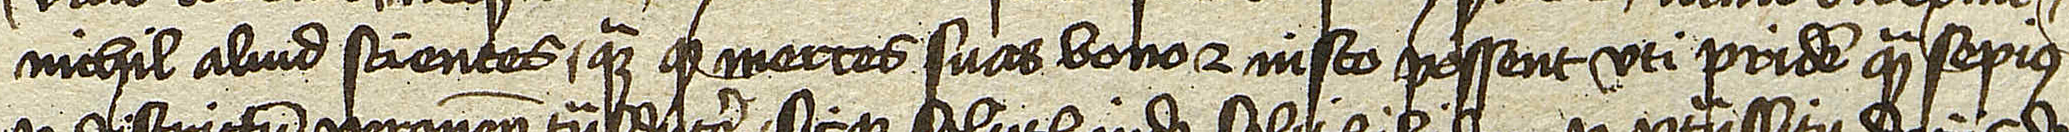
nichil aliud ſcientes / q* q* merces ſuas bono @ iuſto poſſent vti pride* q* ſepi*
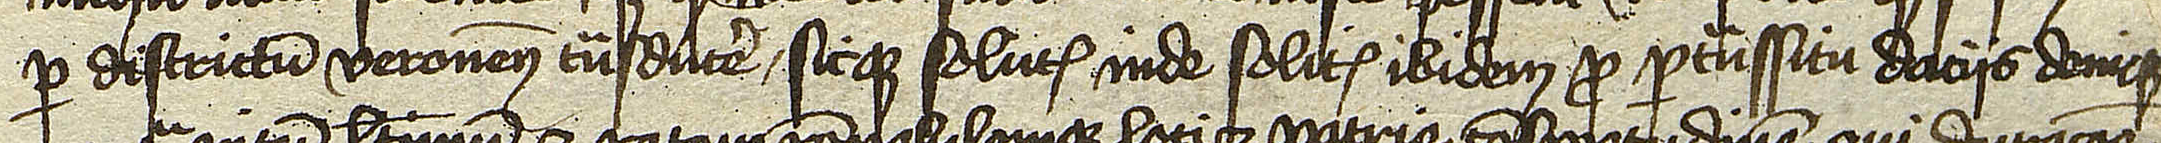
p* diſtrictu* Veronen* t*nſduce* / ſicq* ſolut* inde ſolit* ibidem p* p*t*nſſitu daciis deniq*
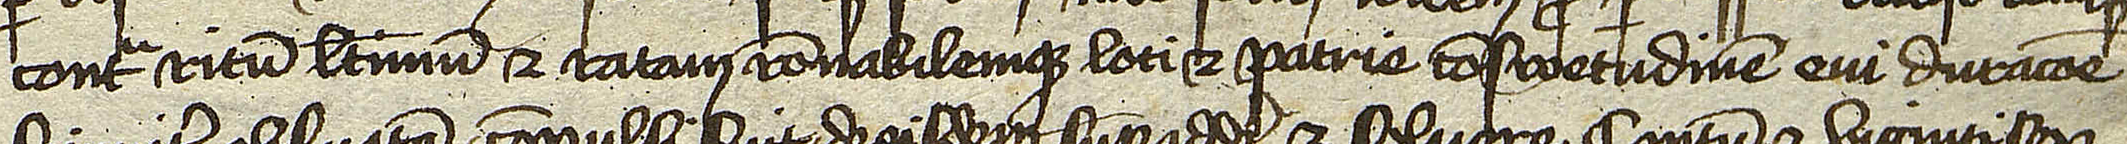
cont* ritu* l*timu* @ ratam r*o*nabilemq* loci @ patrie co*ſuetudine* eui durac*o*e
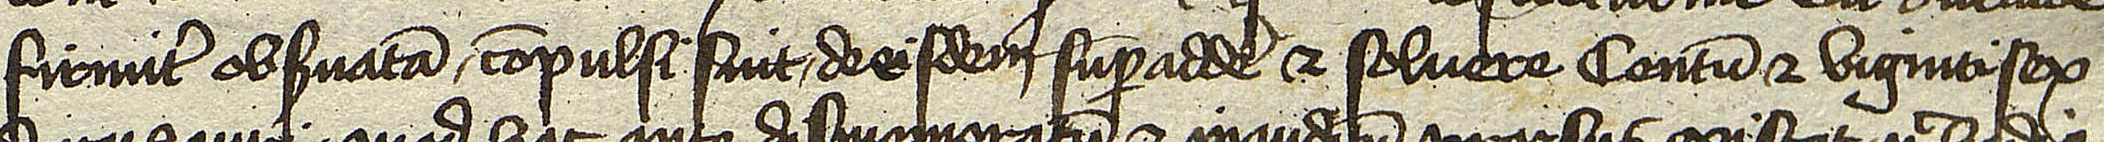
firmit* obſ*uata* / co*pulſi ſint / de eiſdem ſup* adde* et ſoluere Centu* @ vigintiſex
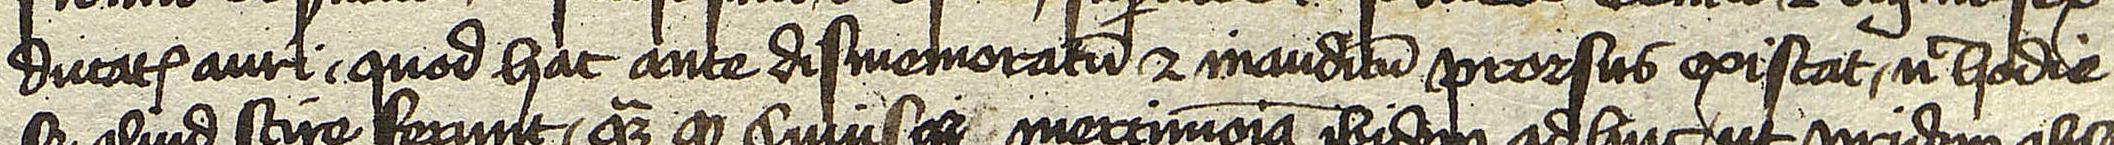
ducat* auri / quod hac ante diſmemoratu* @ inauditu* prorſus exiſtat / n* hodie
